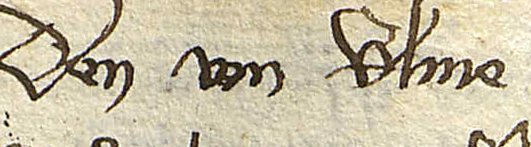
Den von Vlme
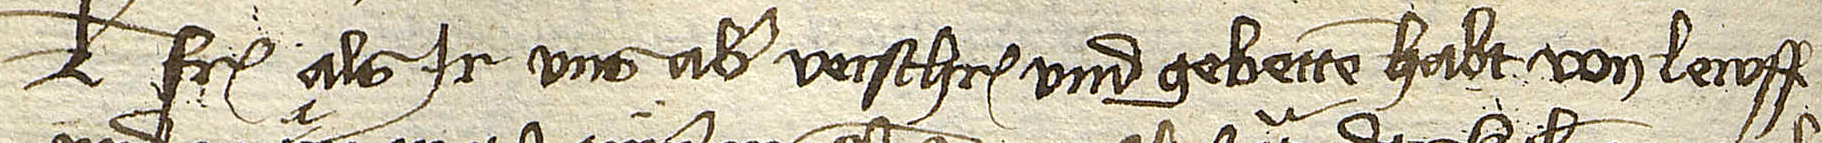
L* fr* als Ir vns ab* verſchr* vnd gebette* habt von lewff
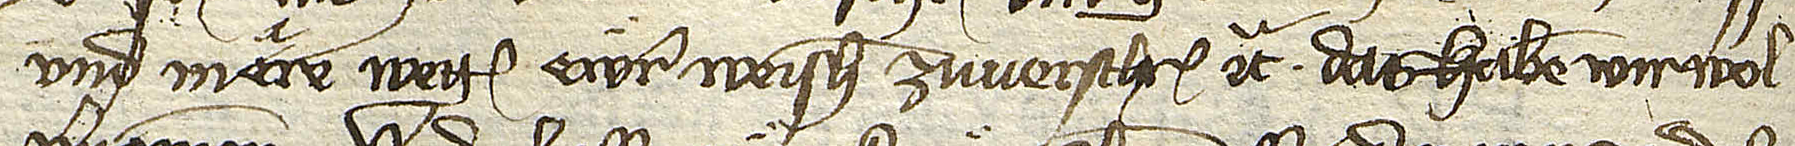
vnd mëre weg* eẅr* weiſh* ʒuverſchr* ec* . das habe* wir wol
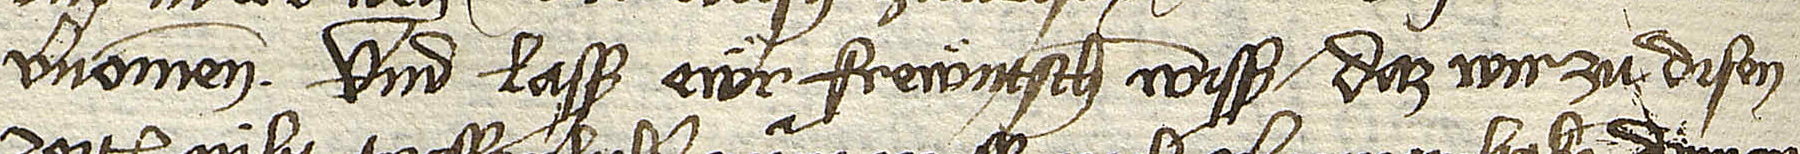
v*nomen . Vnd laſſ* eẅr freẅntſch* wiſſ* / daʒ wir ʒu diſen
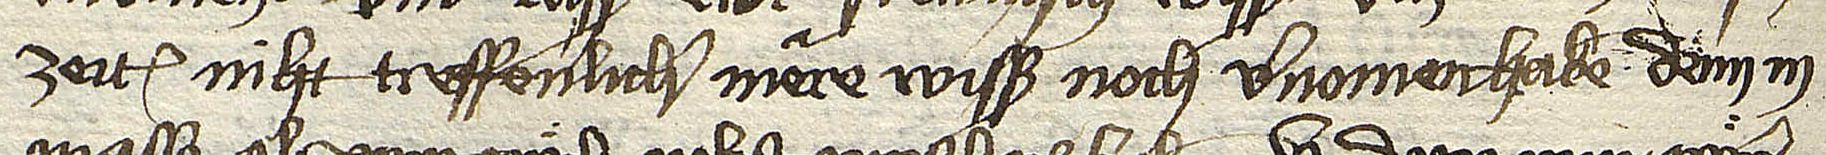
ʒeit* niht treffenlich* mëre wiſſ* noch v*nomen habe* . denn in
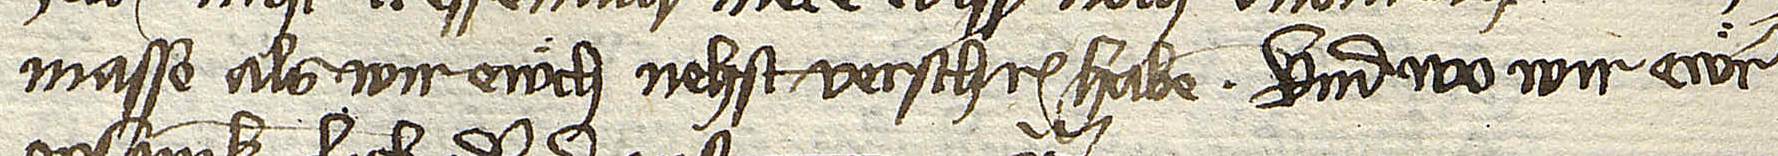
maſſe als wir eẅch nehſt verſchr* habe* . Vnd wo wir eẅr*
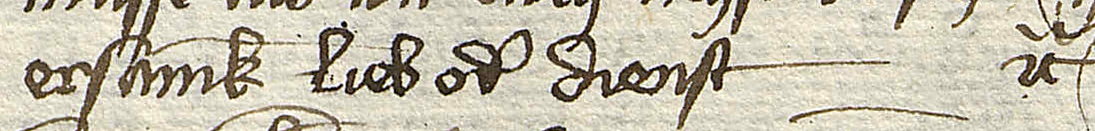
erſamk* lieb od* dienſt ec*
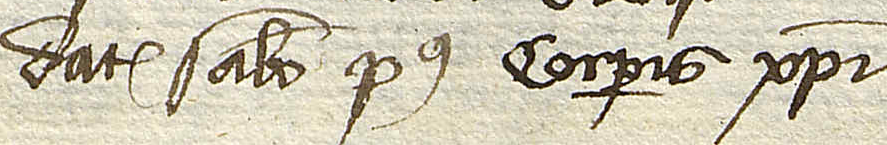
Dat* ſabo* p* Corpis* xpi*
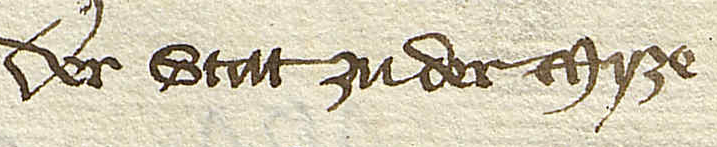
Der Stat ʒu der Myʒe
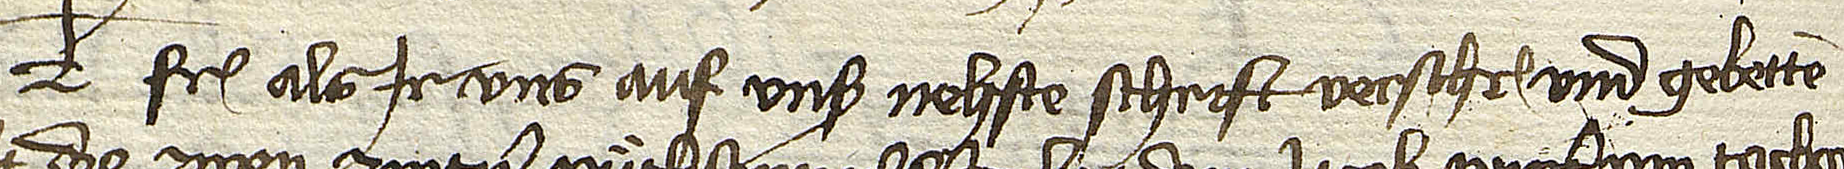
L* fr* als Ir vns auf vnſ* nehſte ſchrift verſchr* vnd gebette*
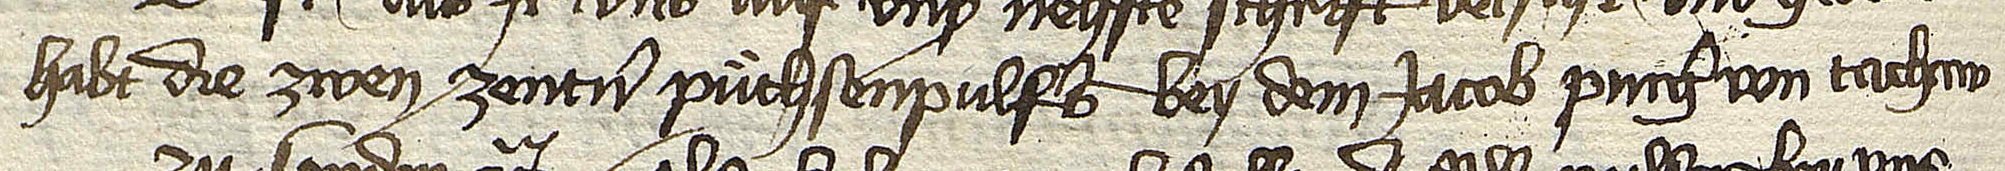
habt die ʒwen ʒent*n püchſenpulf*s bey dem Iacob purg* von tachaw
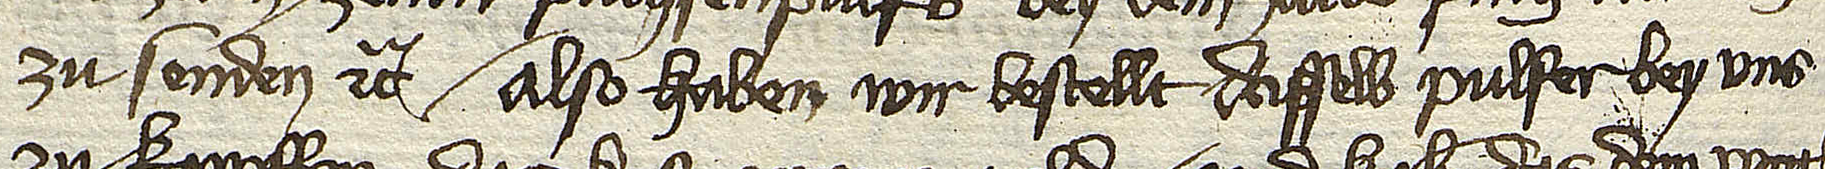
ʒu ſenden ec* / alſo haben wir beſtellt daſſelb pulfer bey vns
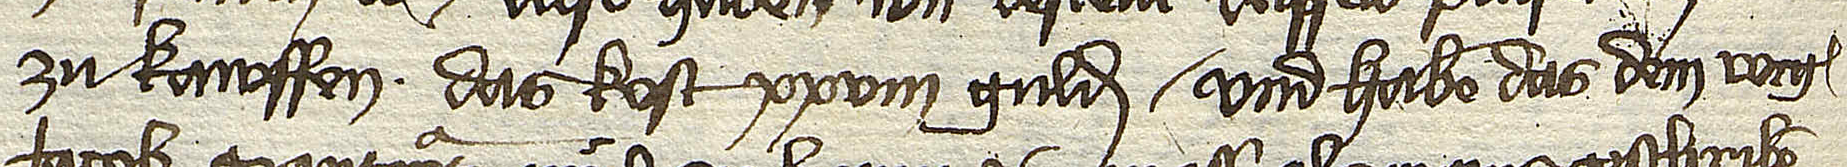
ʒu kawffen . das koſt xxviii guld* / vnd habe* das dem vorg*
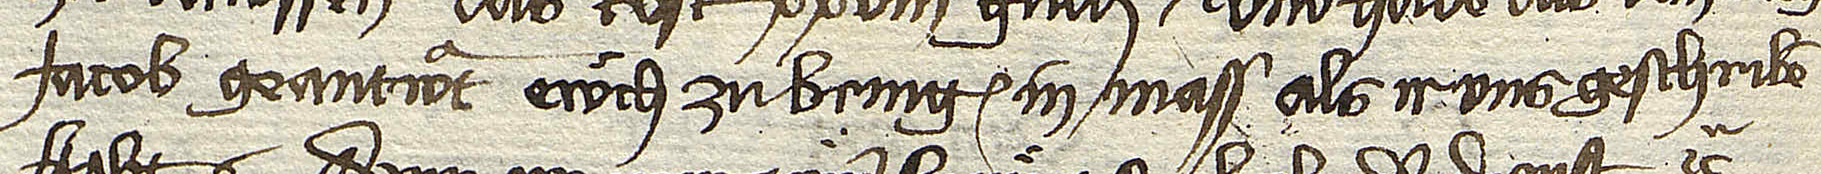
Iacob geantw*t eẅch ʒu bring* in maſſ als ir vns geſchribe*
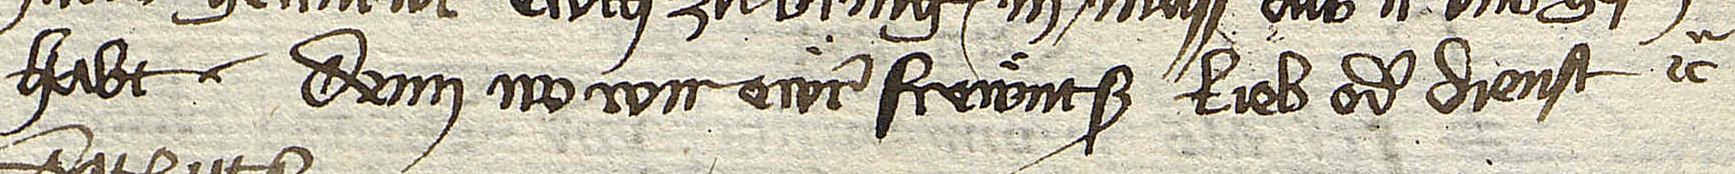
habt / Denn wo wir eẅr* freẅntſ* lieb od* dienſt ec*
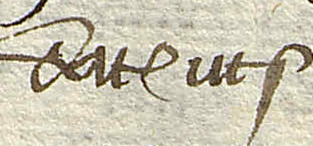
Dat* ut ſ
